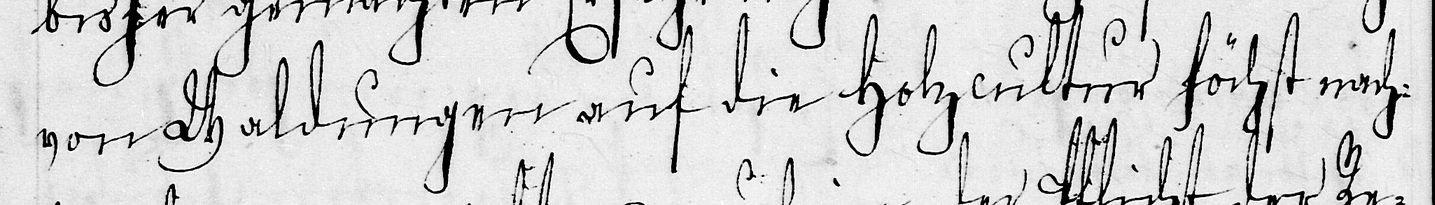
von Waldungen auf die Holzcultur höchst nach¬
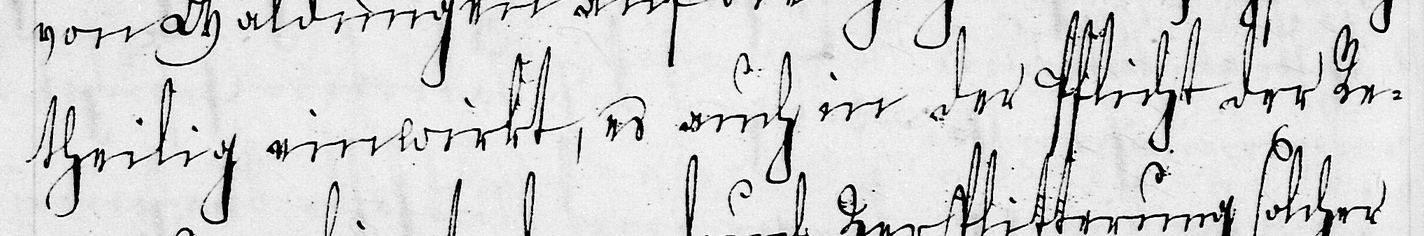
theilig einwirkt, es auch in der Pflicht der Re¬
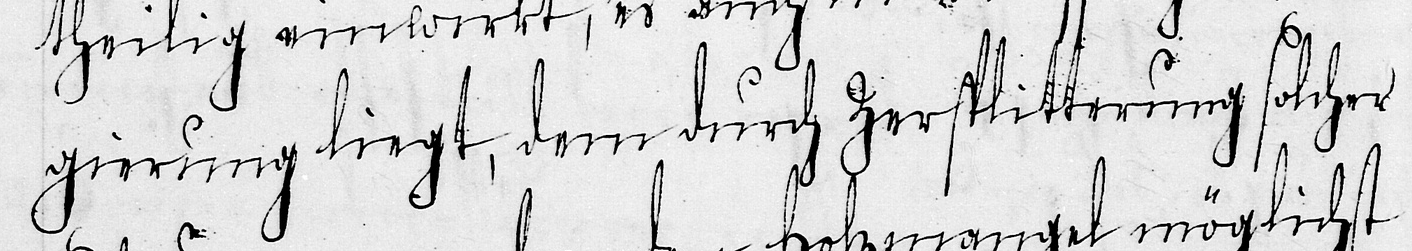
gierung liegt, dem durch Zersplitterung solcher
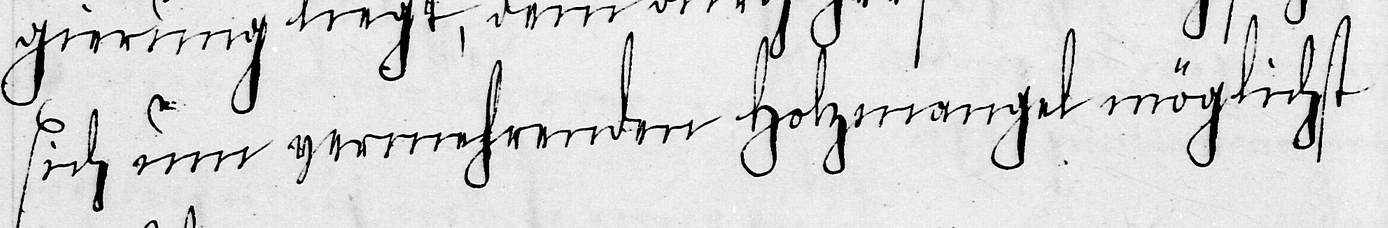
sich um vermehrenden Holzmangel möglichst
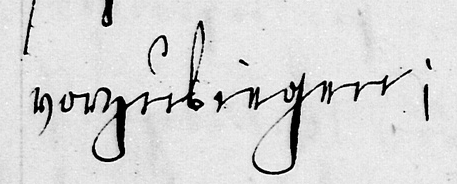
vorzubiegen;
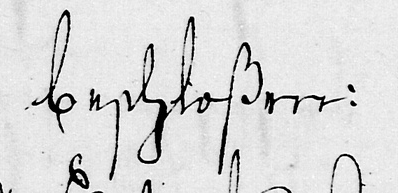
beschloßen:
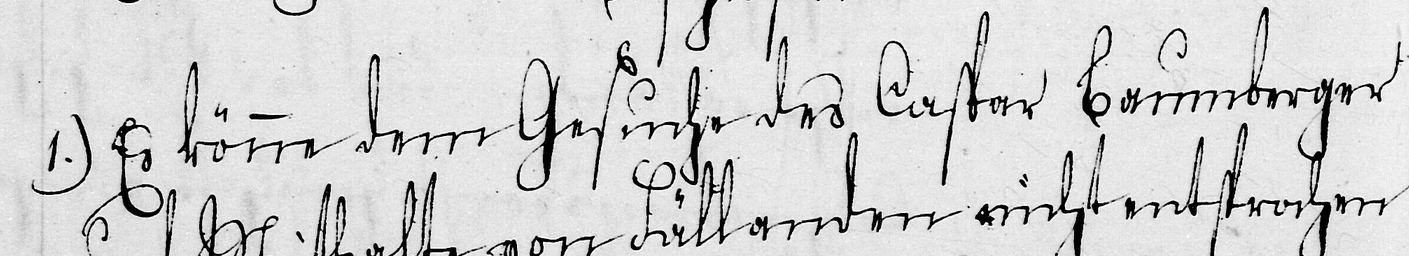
1.) Es könne dem Gesuche des Caspar Baumberger
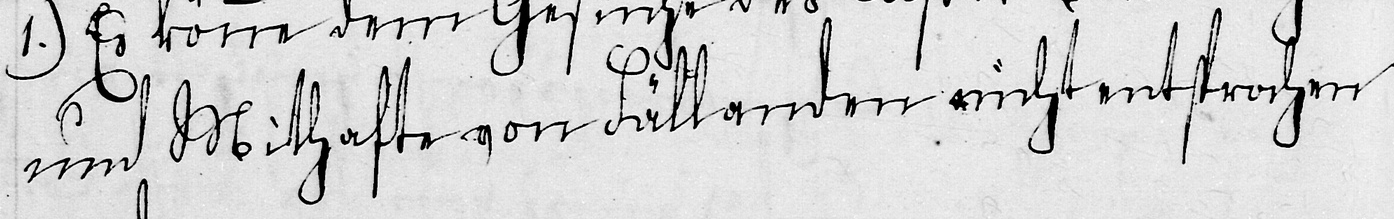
und Mithafte von Fällanden nicht entsprochen
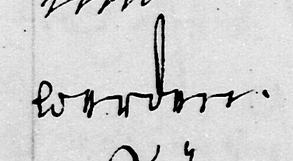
werden.
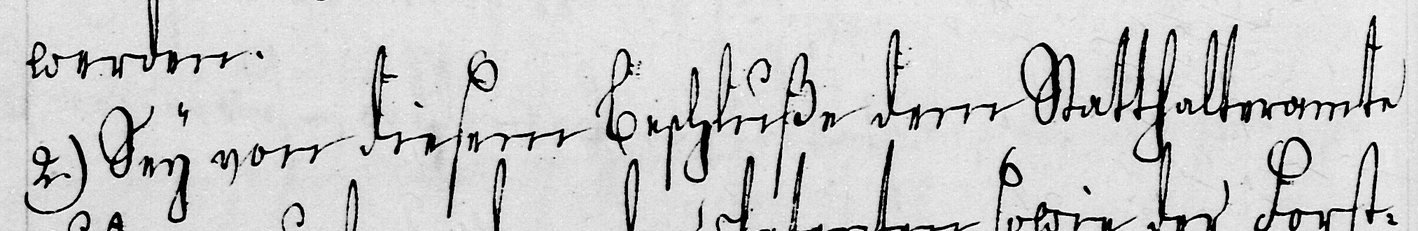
2.) Sey von diesem Beschluße dem Statthalteramte
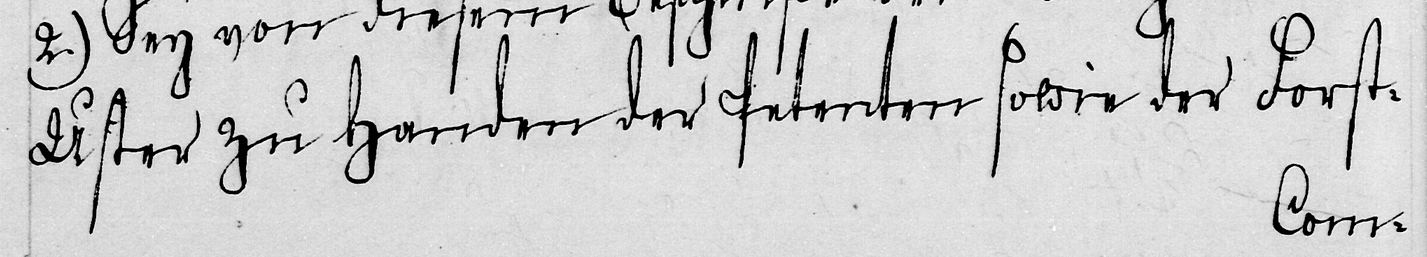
Uster zu Handen der Petenten sowie der Forst-
